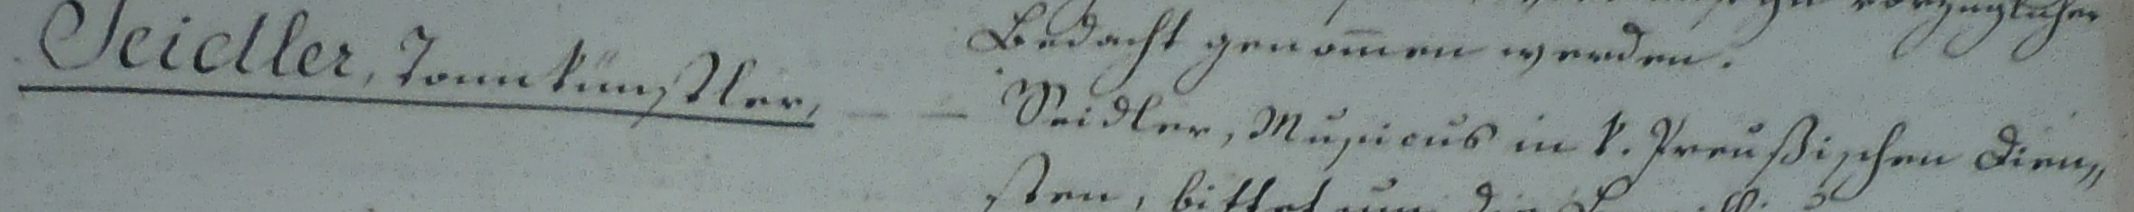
Seidler, Tonnkünstler, _ _ Seidler, Musicus in K. Preußischen Dien¬
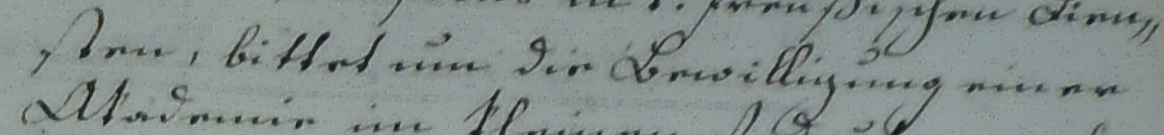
sten, bittet um die Bewilligung einer
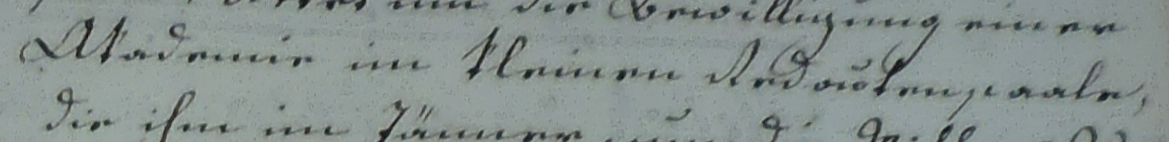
Akademie im kleinen Redoutensaale,
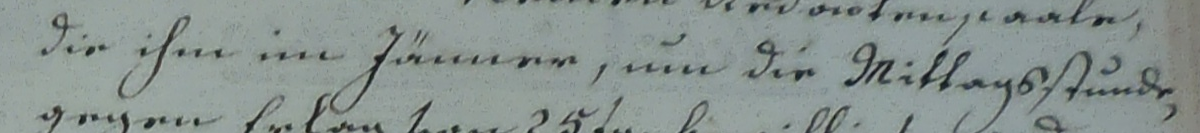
die ihm im Jänner, um die Mittagsstunde,
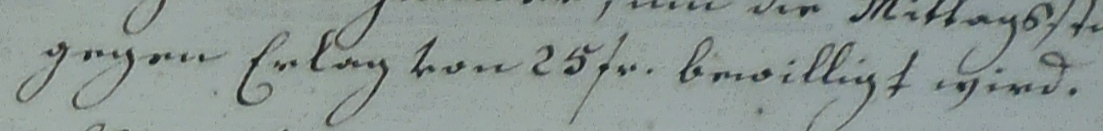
gegen Erlag von 25 fr. bewilligt wird.
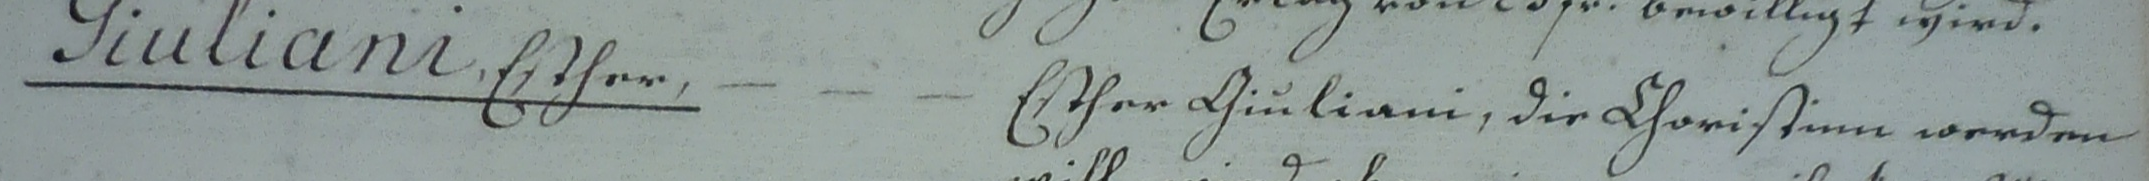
Giuliani, Esther, _ _ _ Esther Giuliani, die Choristinn werden
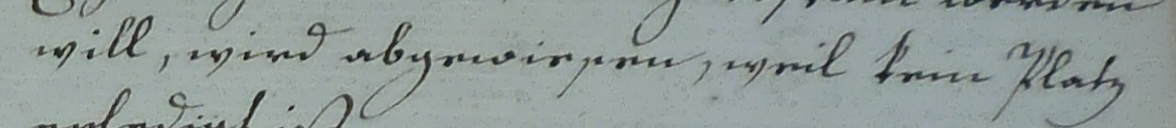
will, wird abgewiesen, weil kein Platz
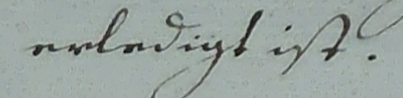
erledigt ist.
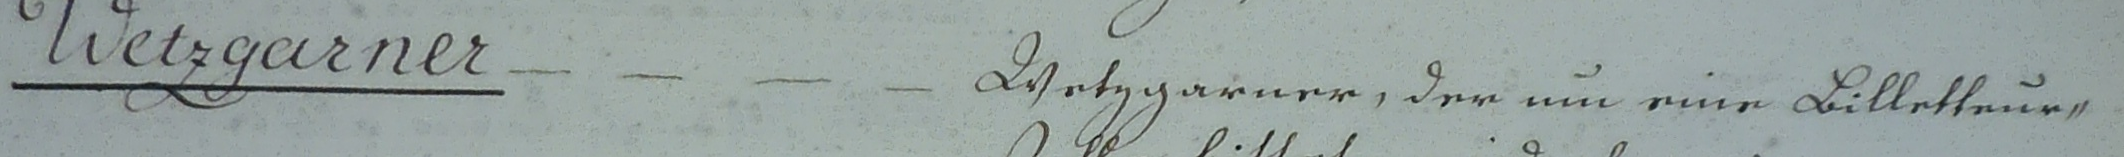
Wetzgarner _ _ _ _ Wetzgarner, der um eine Billetteur¬
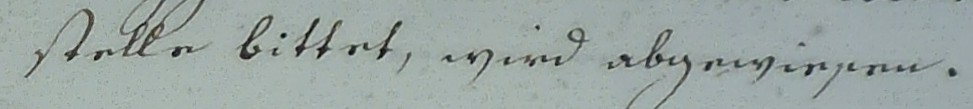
stelle bittet, wird abgewiesen.
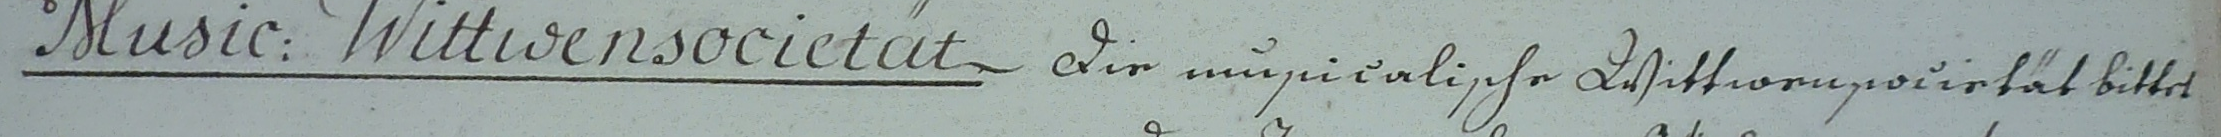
Music: Wittensocietät Die musicalische Wittwensocietät bittet
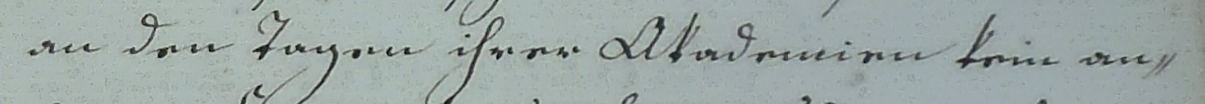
an den Tagen ihrer Akademien kein an¬
